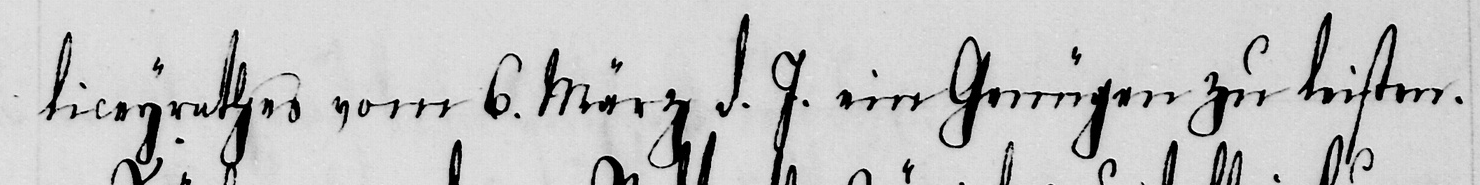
liceyrathes vom 6. März d. J. ein Genügen zu leisten.
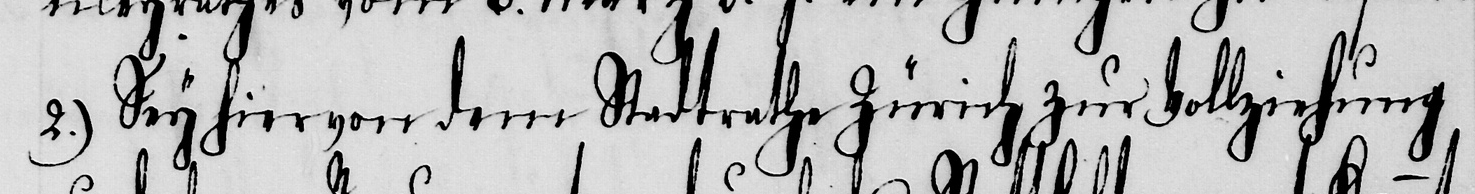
2.) Sey hier von dem Stadtrathe Zürich zur Vollziehung
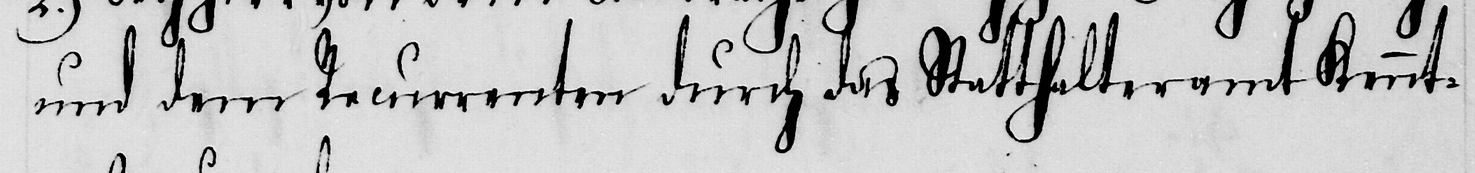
und dem Recurrenten durch das Statthalteramt Kennt¬
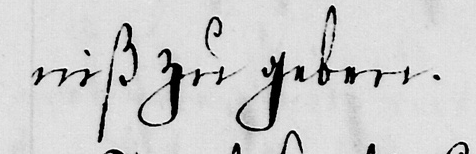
niß zu geben.
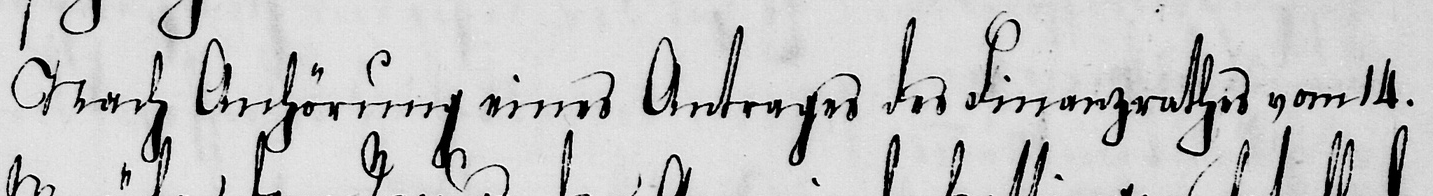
Nach Anhörung eines Antrages des Finanzrathes vom 14.
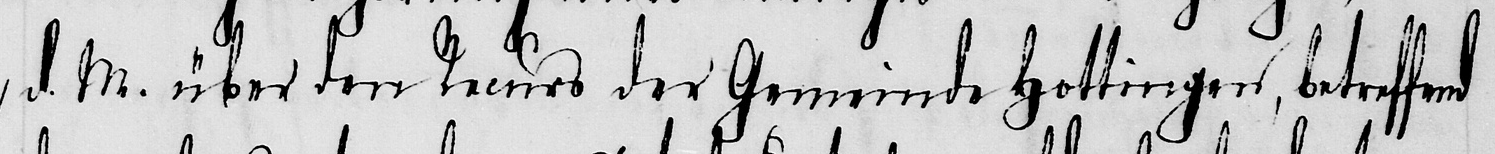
d. M. über den Recurs der Gemeinde Hottingen, betreffend
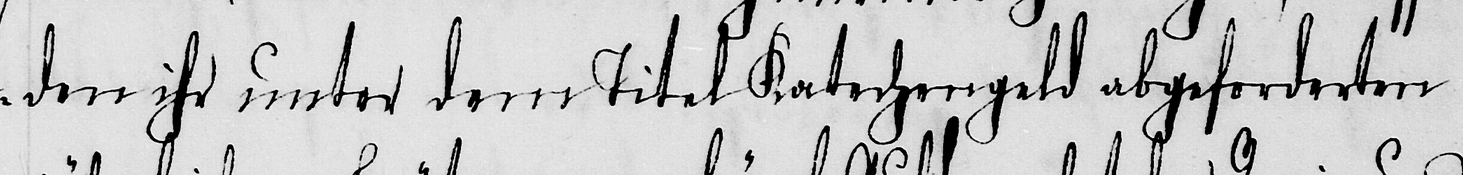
den ihr unter dem Titel Katechetengeld abgeforderten
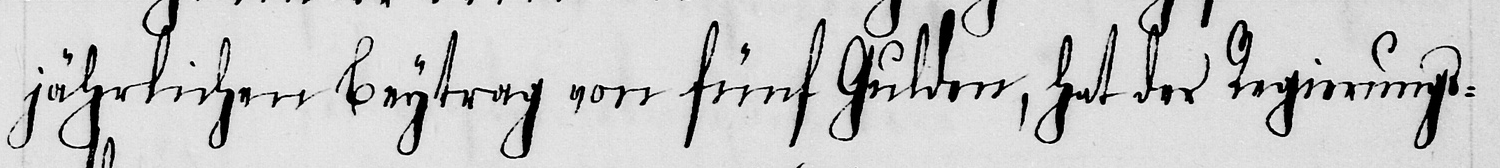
jährlichen Beytrag von fünf Gulden, hat der Regierungs¬
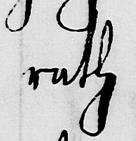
rath
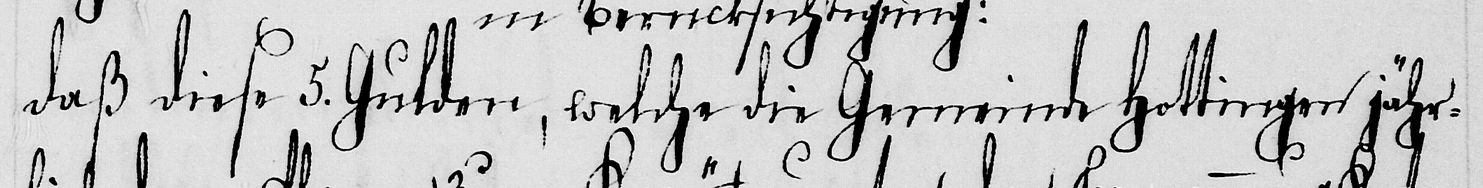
daß diese 5. Gulden, welche die Gemeinde Hottingen jähr¬
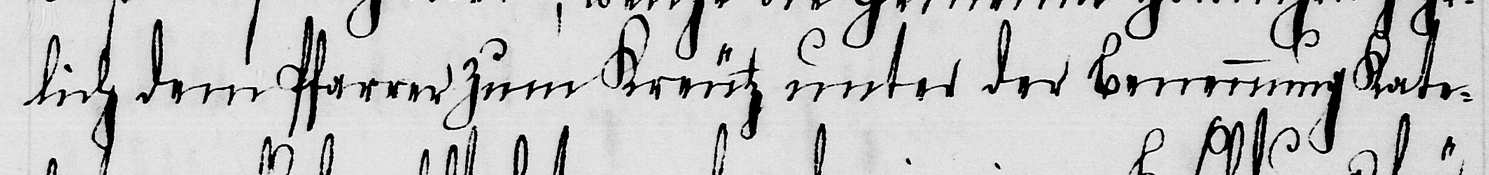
lich dem Pfarrer zum Kreutz unter der Benennung Kate¬
